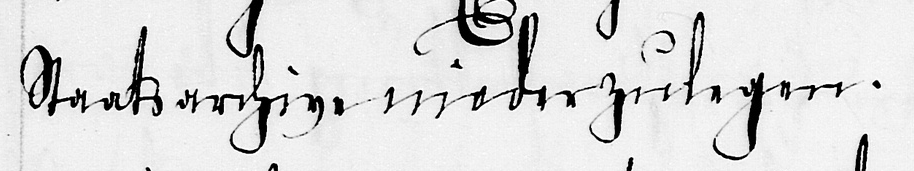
Staatsarchive niederzulegen.
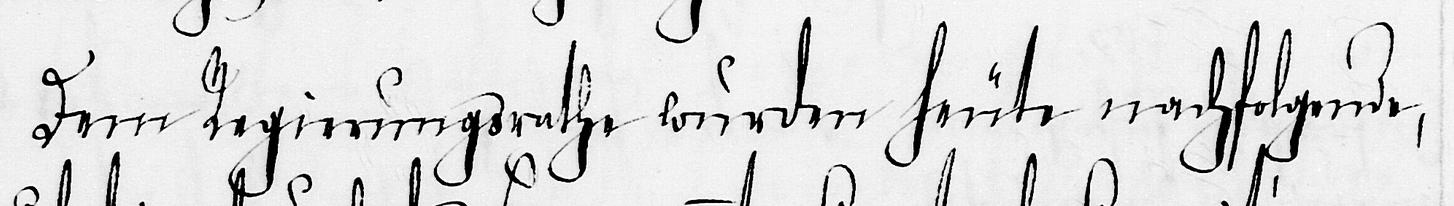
Dem Regierungsrathe wurden heute nachfolgende,
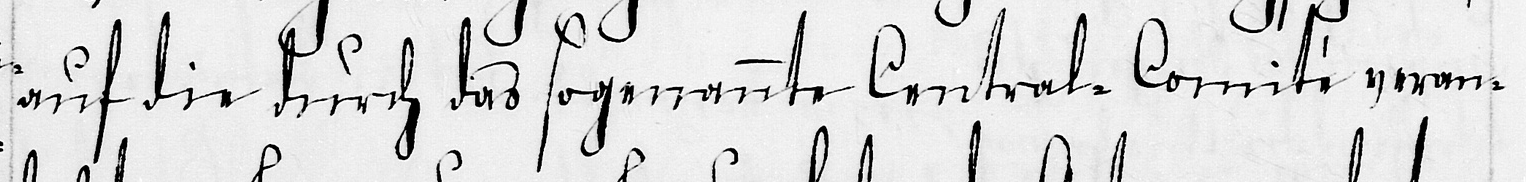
auf die durch das sogenannte Central-Comité veran¬
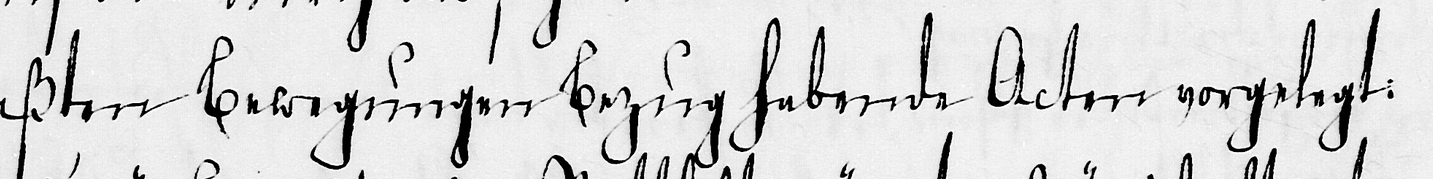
ßten Bewegungen Bezug habende Acten vorgelegt:
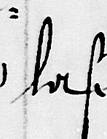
la¬
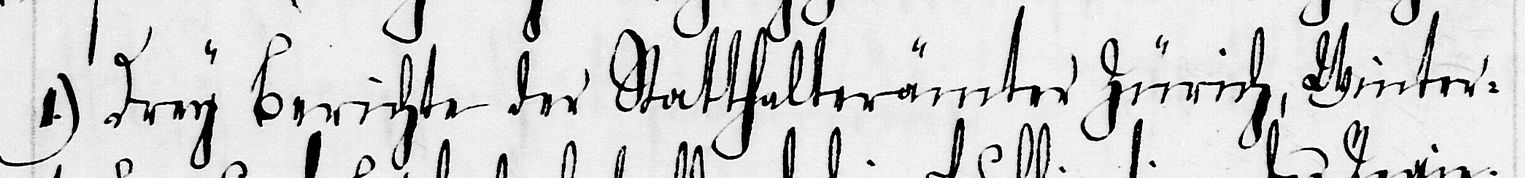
1.) Drey Berichte der Statthalterämter Zürich, Winter¬
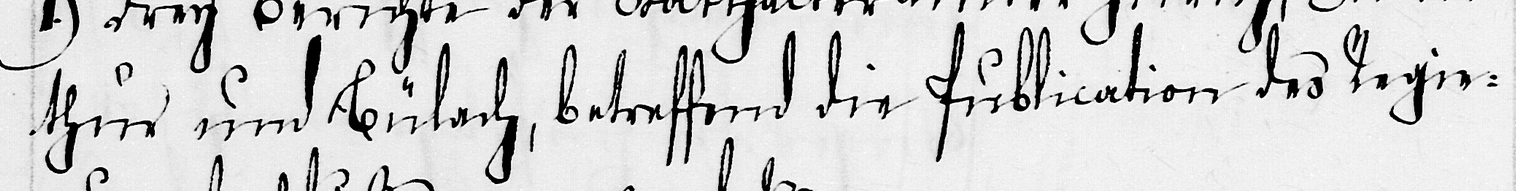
thur und Bülach, betreffend die Publication des Regie¬
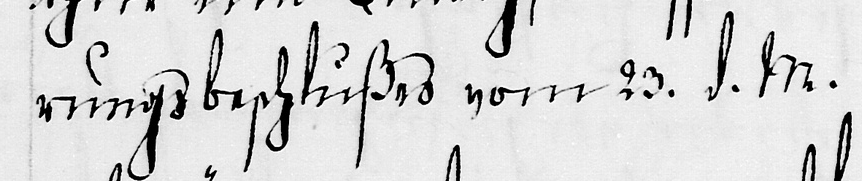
rungsbeschlußes vom 23 d. M.
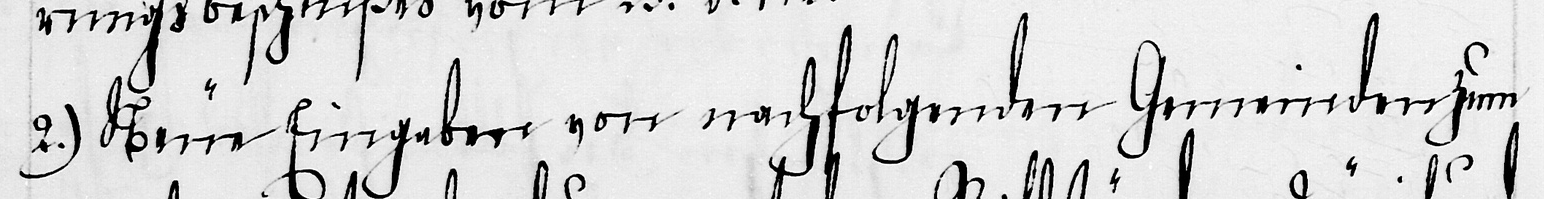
2.) Neue Eingaben von nachfolgenden Gemeinden zum
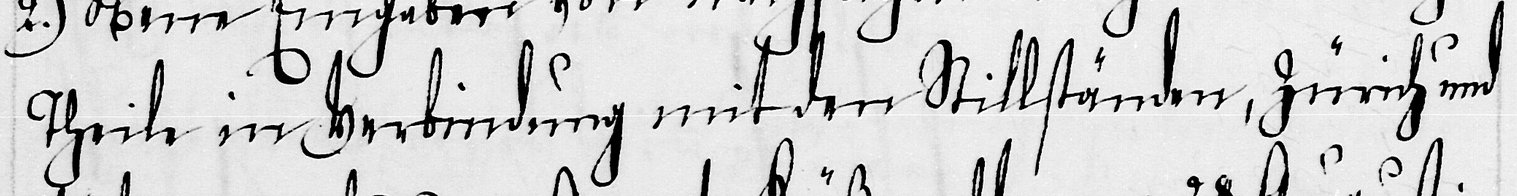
Theile in Verbindung mit den Stillständen, Zürich und
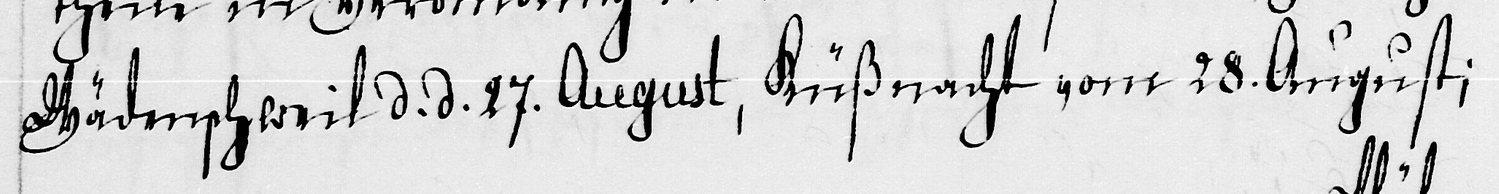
Wädenschweil d. d. 27. August, Küßnacht vom 28. August;
